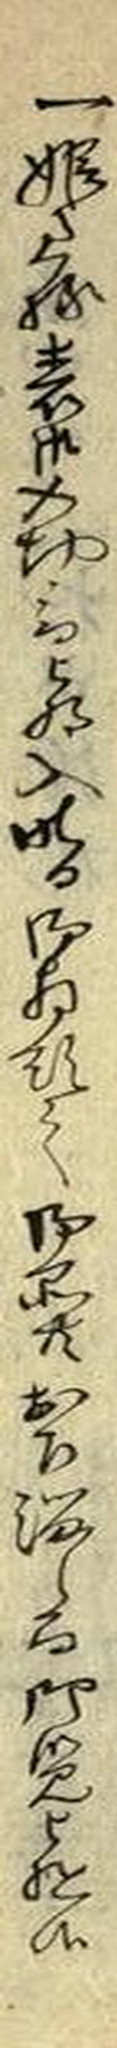一姫君様表御〆切ニ而被為入昨日御拝領之御品共於下溜之間御覧被遊候
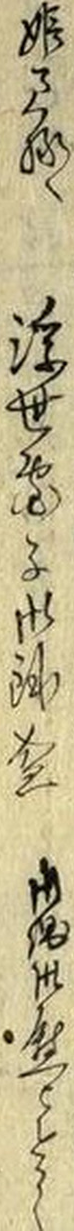姫君様へ浮世団子御鉢盛御側御慰被進之
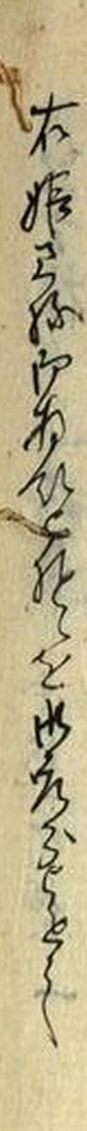右姫君様御拝領被遊候を御取分被進之
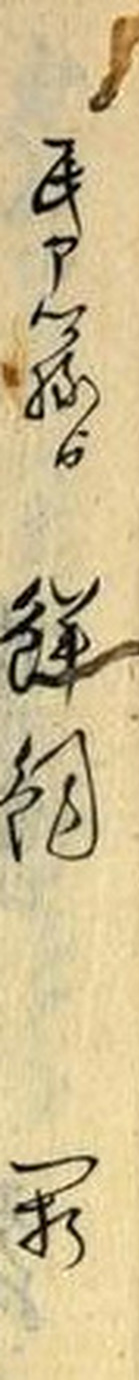民部卿様ゟ鮮鯛一折
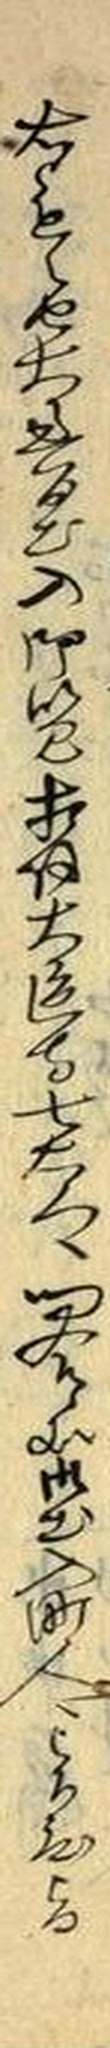右被進候由大奥ゟ出入御覧相伺大道寺七右衛門へ問合候処御出入町人へ被下度旨
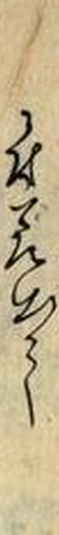ニ付差出之
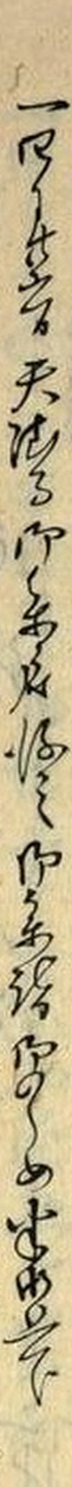一四月廿六日天徳寺御参府後之御参詣御のしめ半御上下
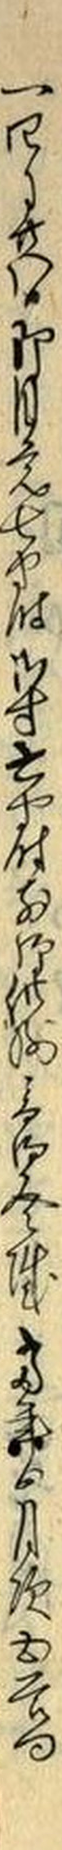一四月廿八日御目覚七半時弐寸六半時前御供揃ニ而御登城当年ゟ月次五節句
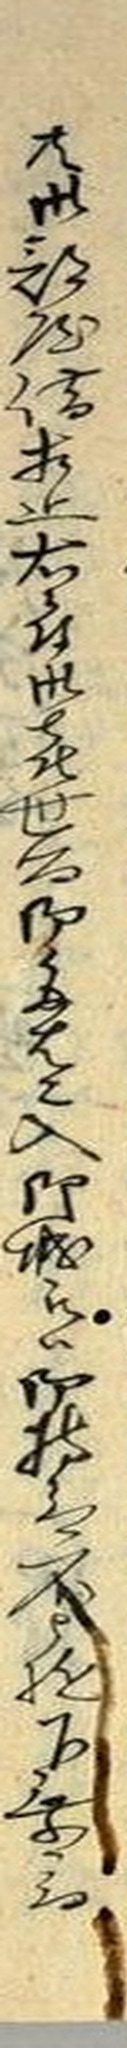共御部屋詰相止右ニ付御きせる御たはこ入御城江ハ御持ニ而不被遊下乗ニ而
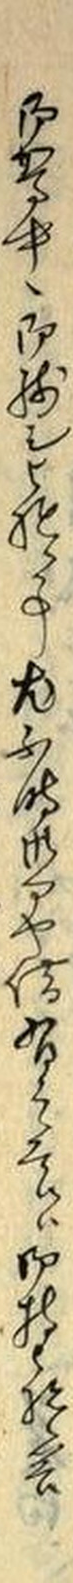御駕中へ御残シ被遊候事尤不時御部ヤ借有之候節ハ御持被遊候筈
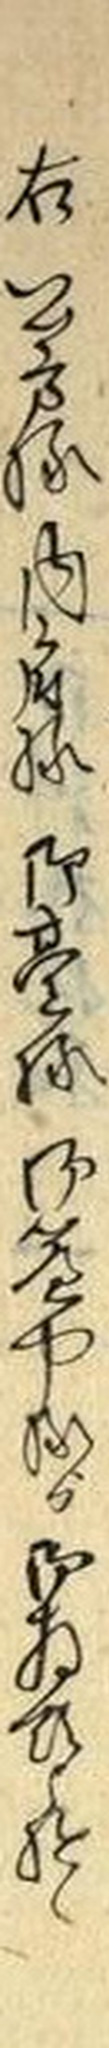右公方様内府様御台様御廉中様ゟ御拝領被遊候
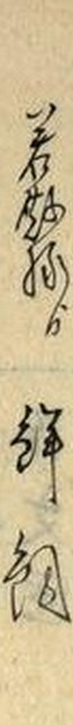若殿様ゟ鮮鯛一
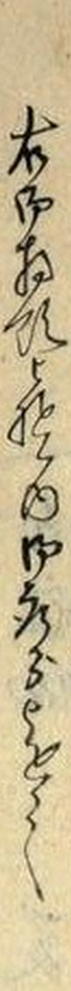右御拝領被遊候内御取分被進之
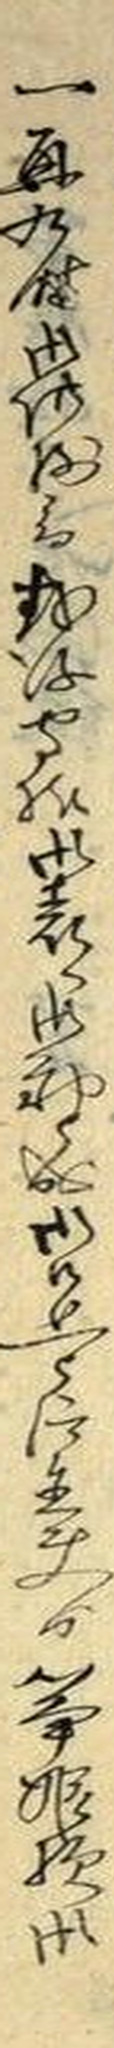一再九時御供揃ニ而越後守様御表へ御勤被成御口上被仰置夫ゟ箏姫様御
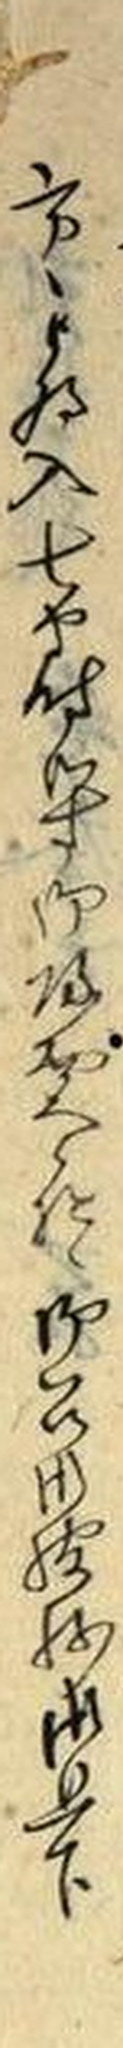方へ被為入七半時弐寸御帰殿被遊候御召御服紗御上下

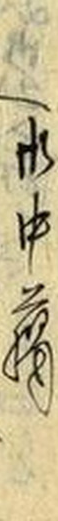御中臈
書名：少傅日録抄（斉承付側向頭取日記、在府）
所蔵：福井県文書館 Fukui Prefectural Archives
